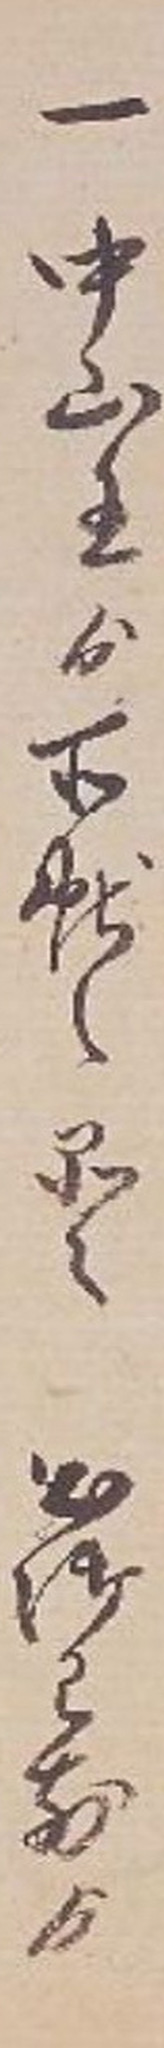一中山王ゟ所献之品々出御已前ゟ
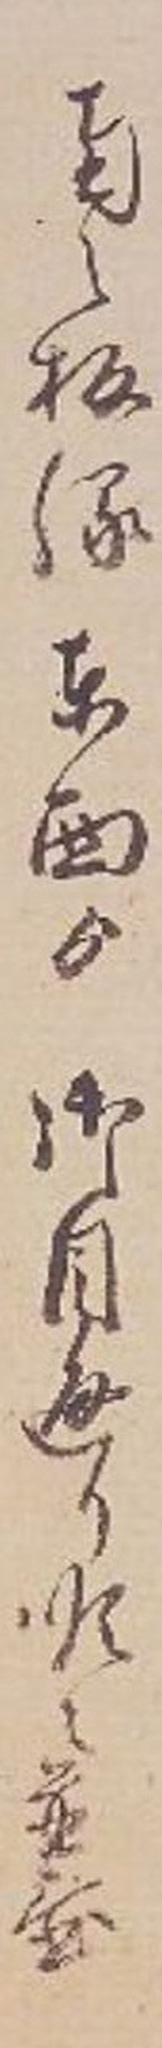南之板縁東西ゟ御目通り順々並置
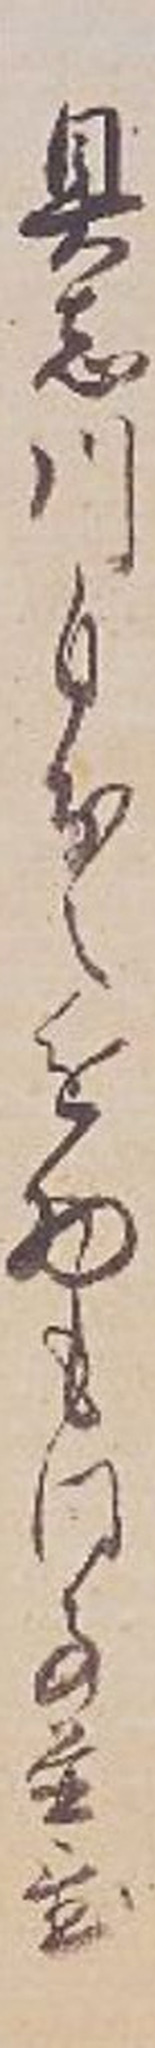具志川自分之進物も同事並置
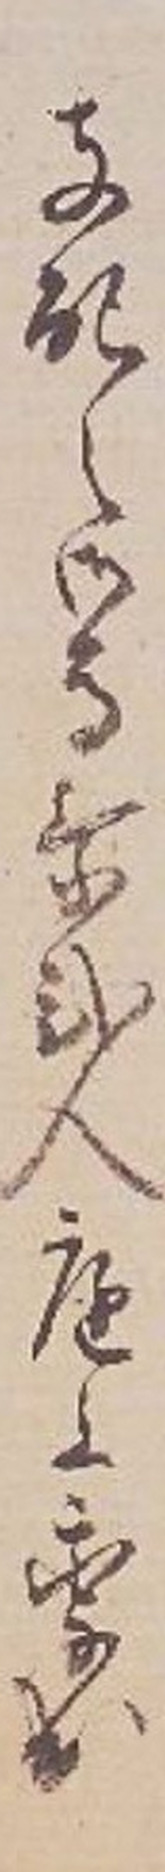支配之御馬寮二人庭上索出
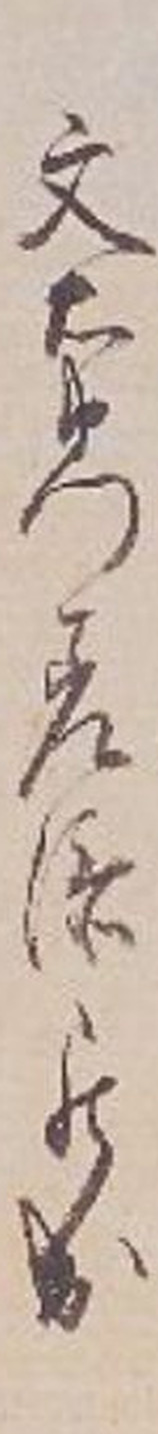文右衛門差添罷出
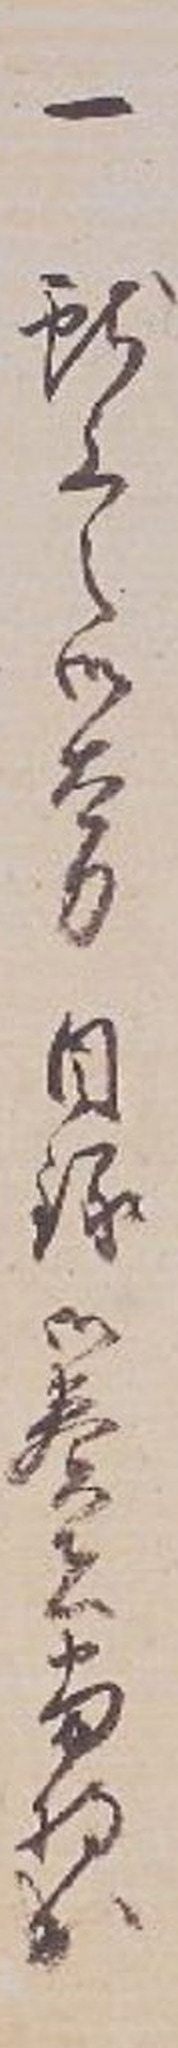一献上之御太刀目録御奏者番持出
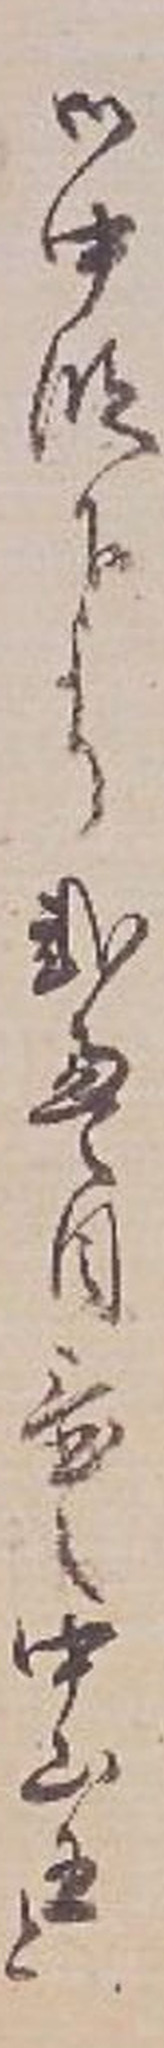御中段下より二畳目置之中山王と

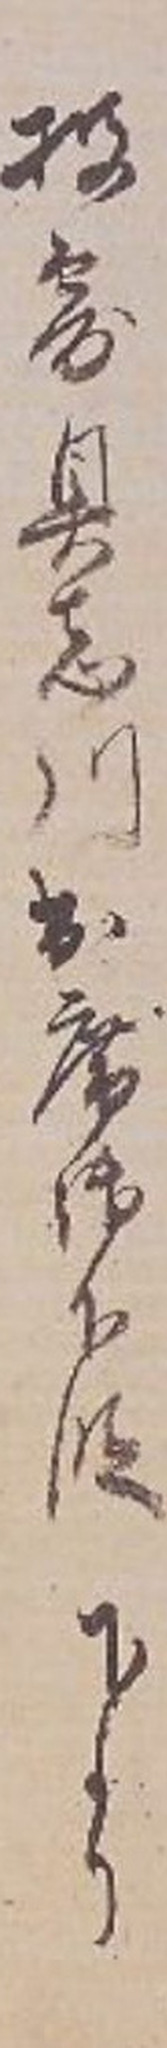披露具志川出席御下段下より
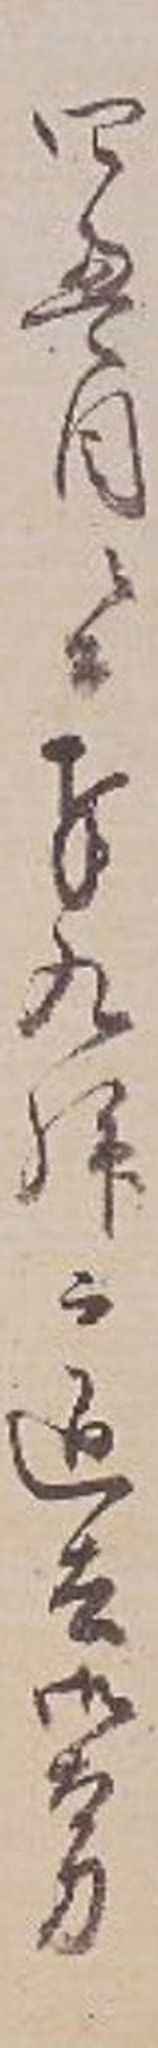四畳目にて奉九拝て退去御太刀
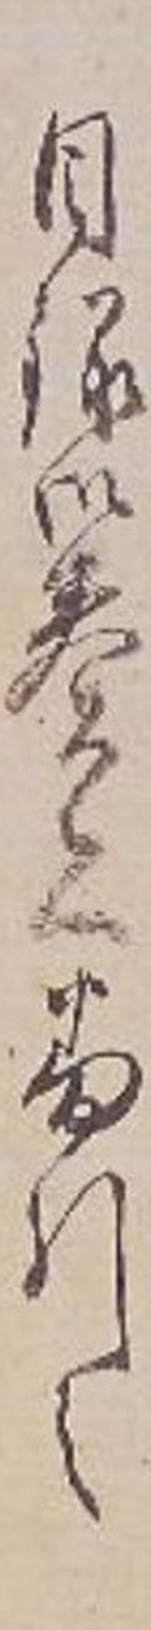目録御奏者番引候
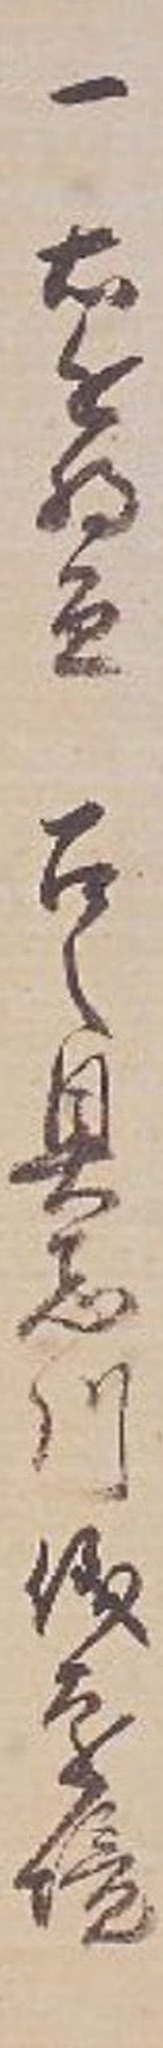一右近将監召之具志川儀遠境
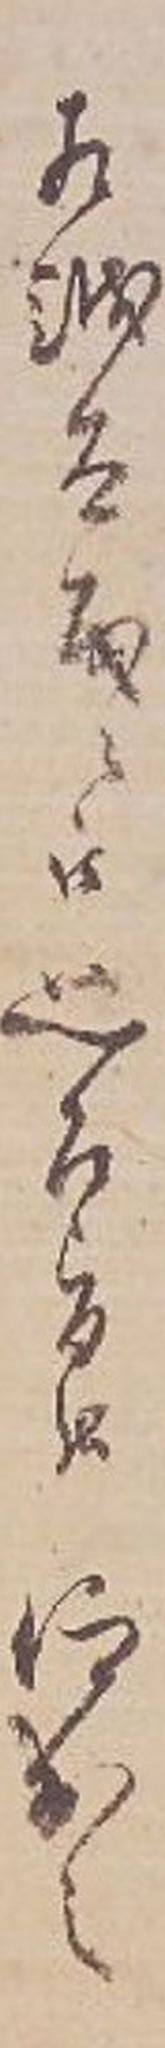相誠太義に候思召旨被仰出候
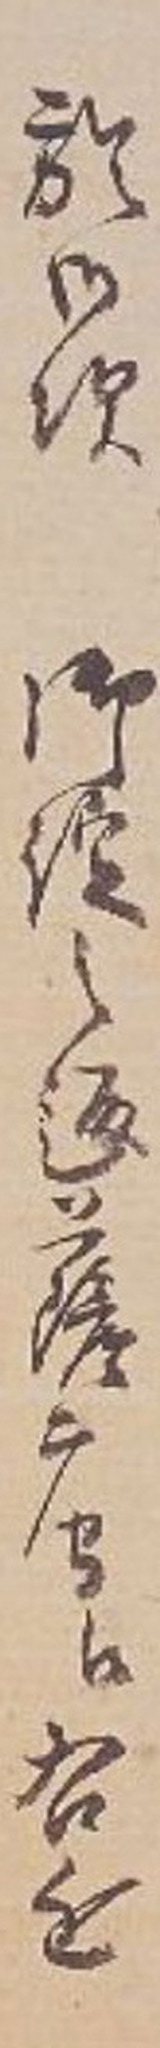於御次御諚の趣薩摩守え右近
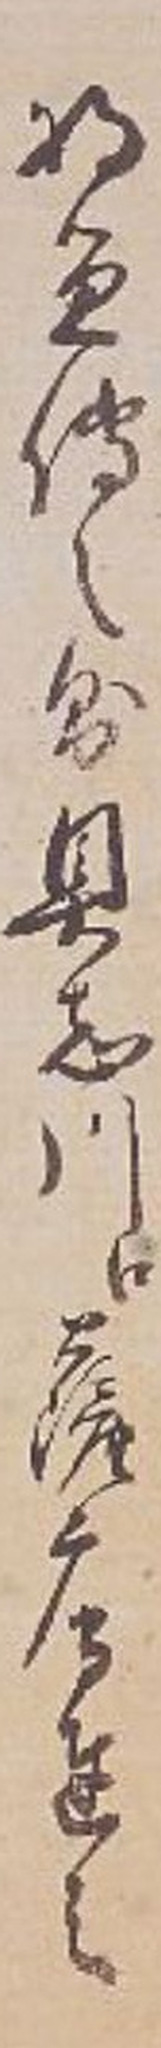将監伝之則具志川え薩摩守進之
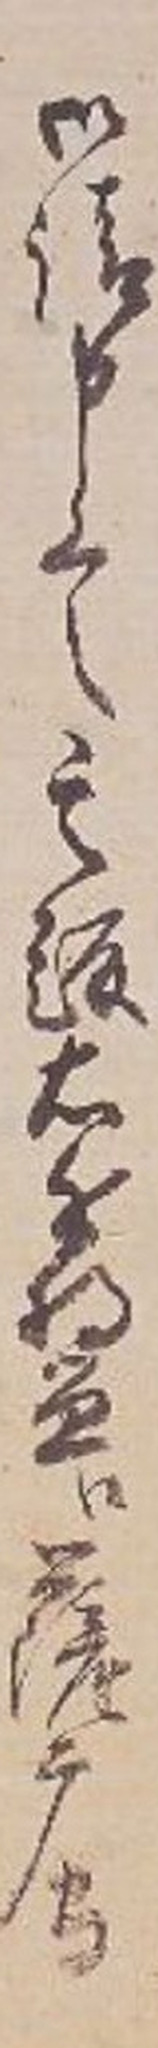御請申上候其趣右近将監え薩摩守
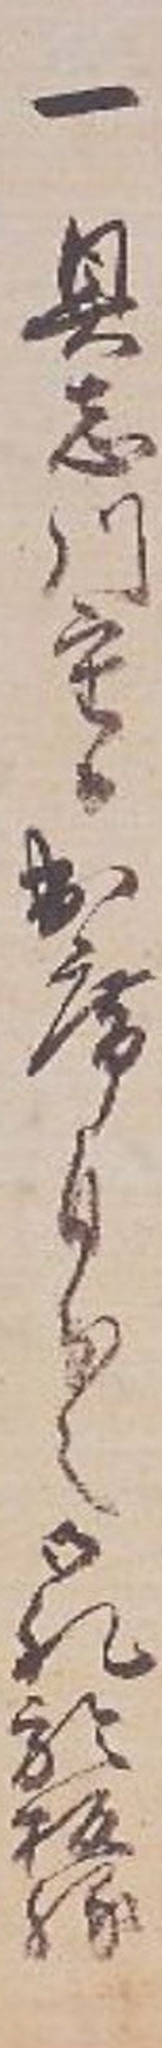一具志川定而出席自分之御礼於板縁
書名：琉球人来朝記 三、四
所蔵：University of the Ryukyus Library
